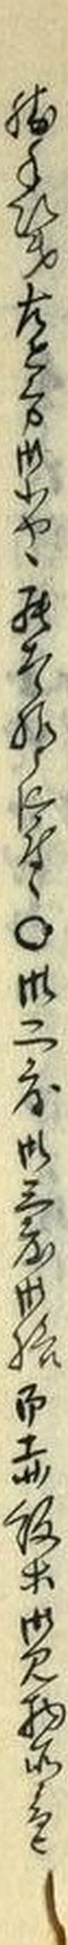勝手次第左近方御小屋へ罷出候様被仰付候〇御二度御三度御膳御赤飯等御見物所ニ而被
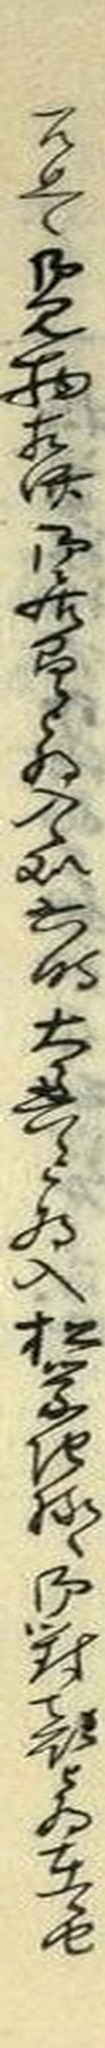召上候御見物相済御居間へ被為入候処六時大奥ニ被為入松栄院様へ御対顔被為在候由
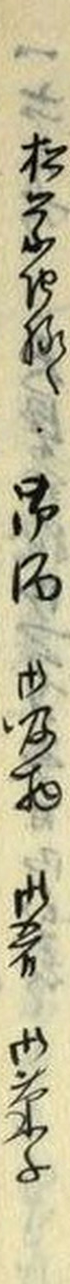松栄院様へ御酒御吸物御肴御菓子
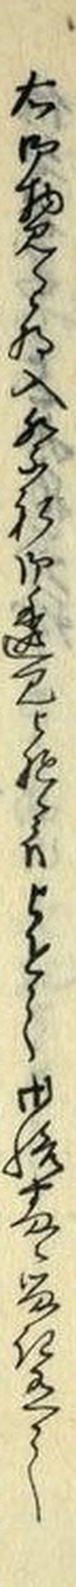右御物見へ被為入祭礼御透見被遊候ニ付被進之御膳番ニ留記有之
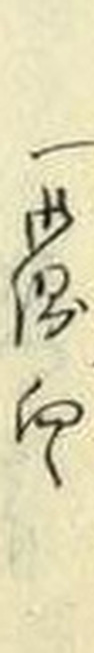御側向へ
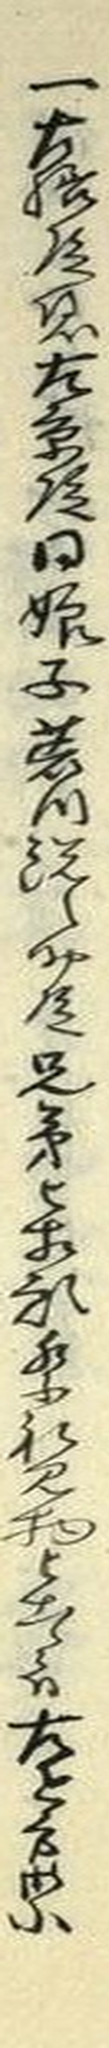一左膳殿息左京殿同娘子荒川鋭之助殿兄弟被相願祭礼見物被出候ニ付左近方御小
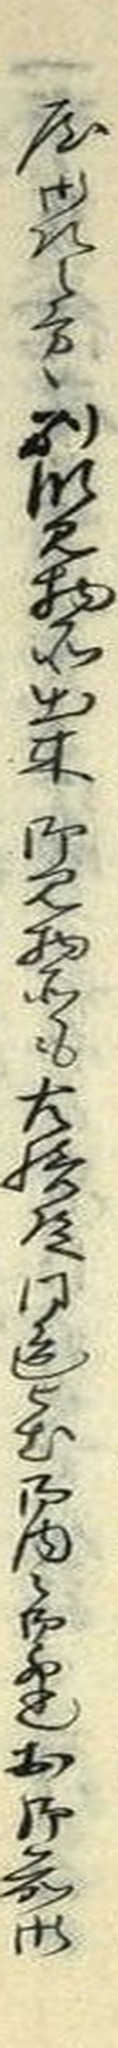屋御次之方へ別段見物所出来御見物所へも左膳殿同道被出御内々御逢於御前御
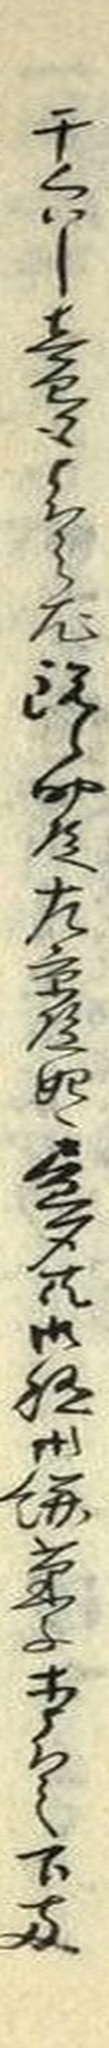干くハし壱包ツヽ被下之尤鋭之助殿左京殿始へ昼夕共御賄御餅菓子等被下之下両
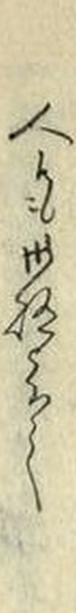人江も御賄被下之
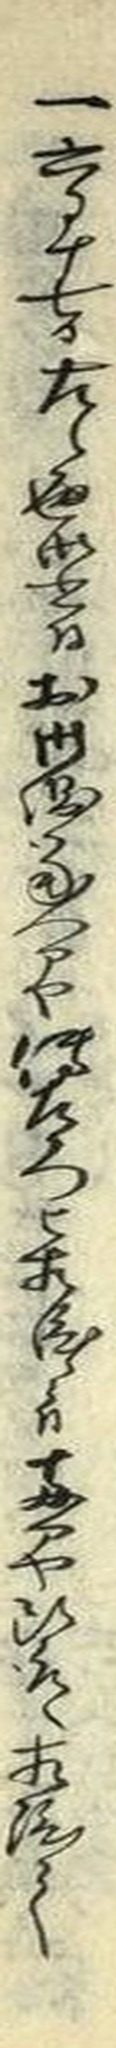一六月十七日左之通御書付於御側御用人部屋伝左衛門被相渡候ニ付両部屋頭取へ相渡之
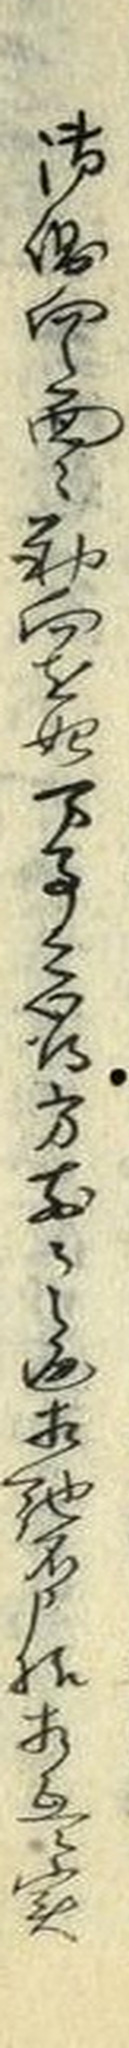御側向之面々勤向を始万事之心得方前々之通相弛不申様相互ニ実
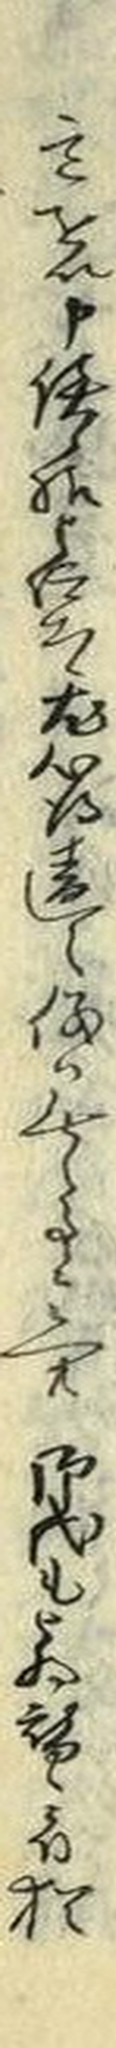意を以申談候様被仰出候尤心得違之儀ハ無之事ニ候へ共御代も被為替候ニ付猶
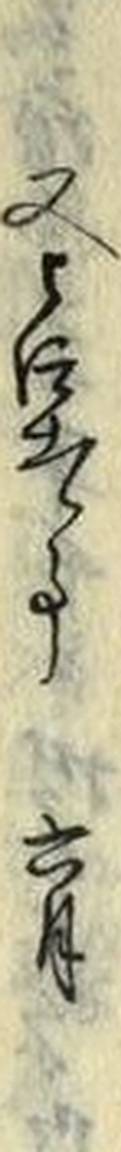又被仰出候事六月

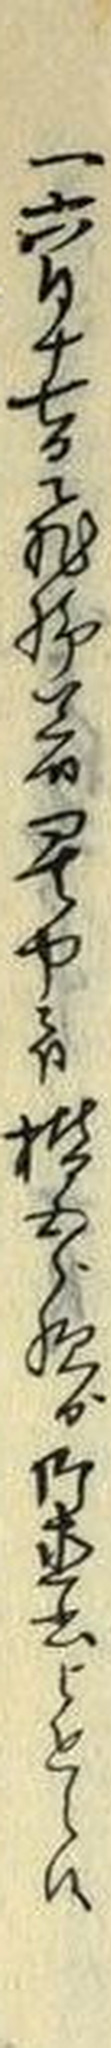一六月十七日飛脚着暑中ニ付楷五郎様ゟ御直書被進之候
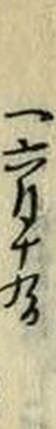一六月十九日
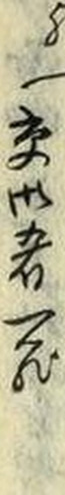交御肴一籠
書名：少傅日録抄（斉善付側向頭取日記、在府）
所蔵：福井県文書館 Fukui Prefectural Archives
